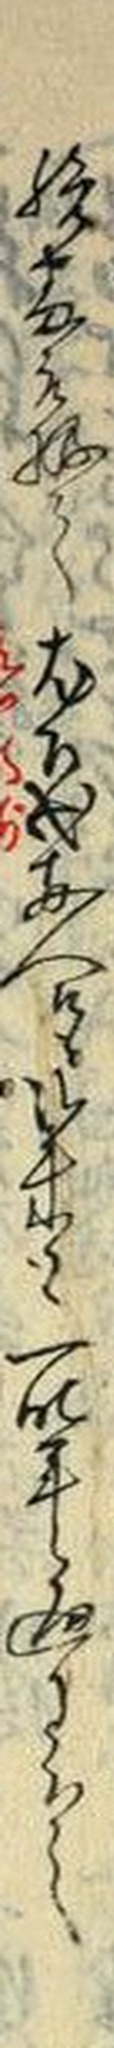膳番取扱之尤下代両人江も弐朱ツゝ一昨年之通被下之
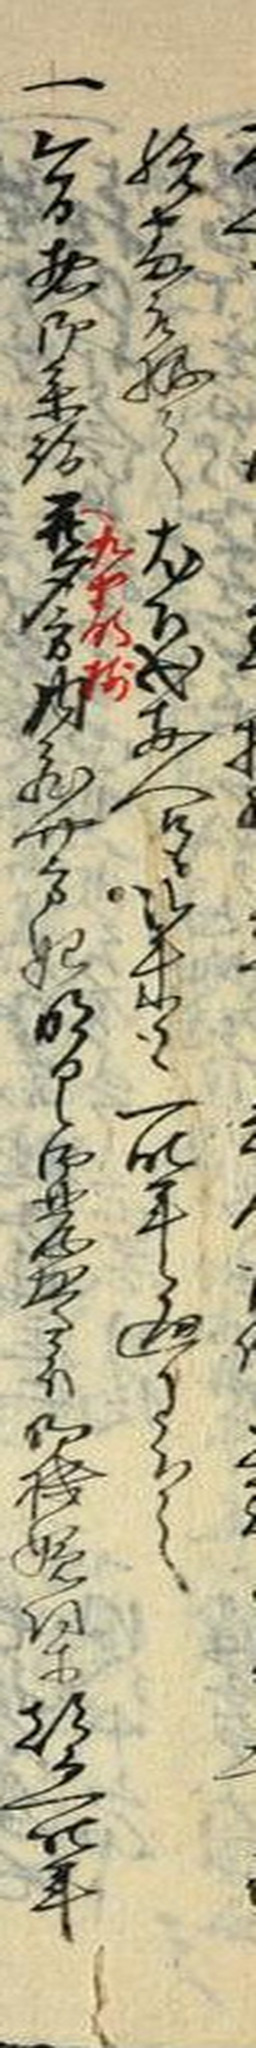一今日惣御参詣并夕方内蔵介方始明日之御発駕ニ付御機嫌伺等都而一昨年
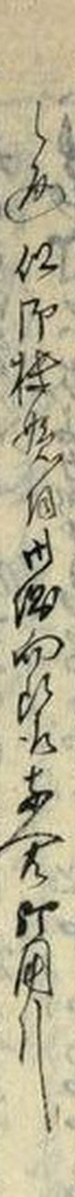之通但御機嫌伺御側向頭取両人共御用引
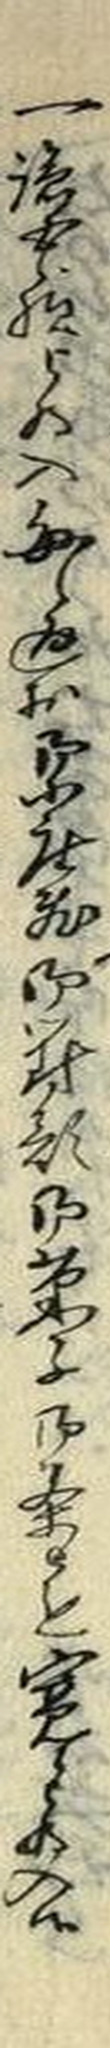一謙五郎様被為入毎之通於御小座敷御対顔御菓子御茶被進寛々被為入候
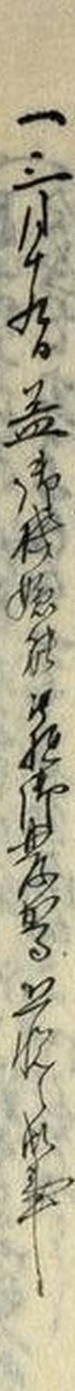一三月十九日益御機嫌能被遊御発駕恐悦之御事
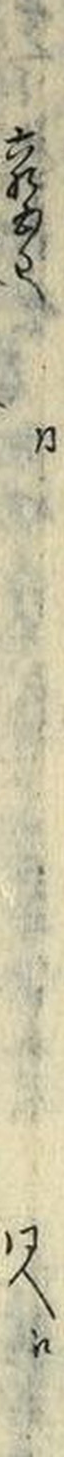六拾五匁同同人江
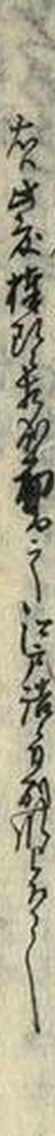右ハ此度棒頭ニ相成初而之江戸詰ニ付別段被下之
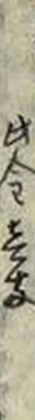此金壱両

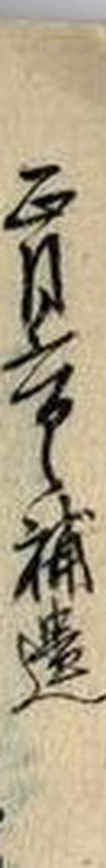正月六日之補遺
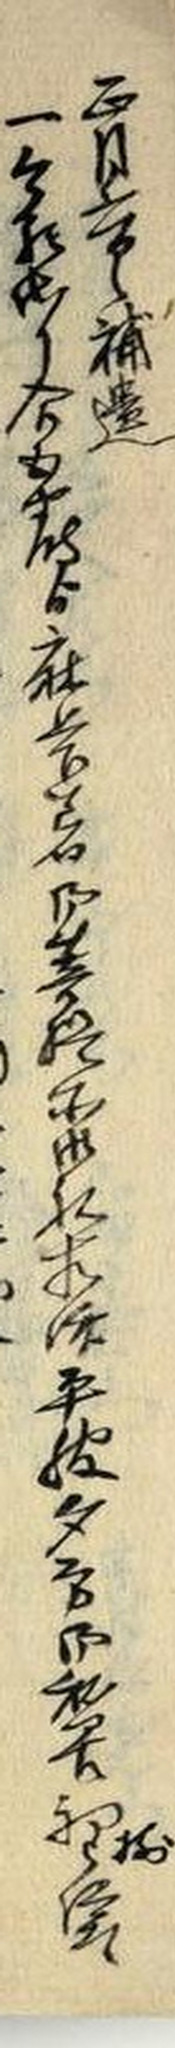一今朝代り合五半時ゟ麻上下着御菩提所御礼相済平服夕方御稽古初揃被仰出候
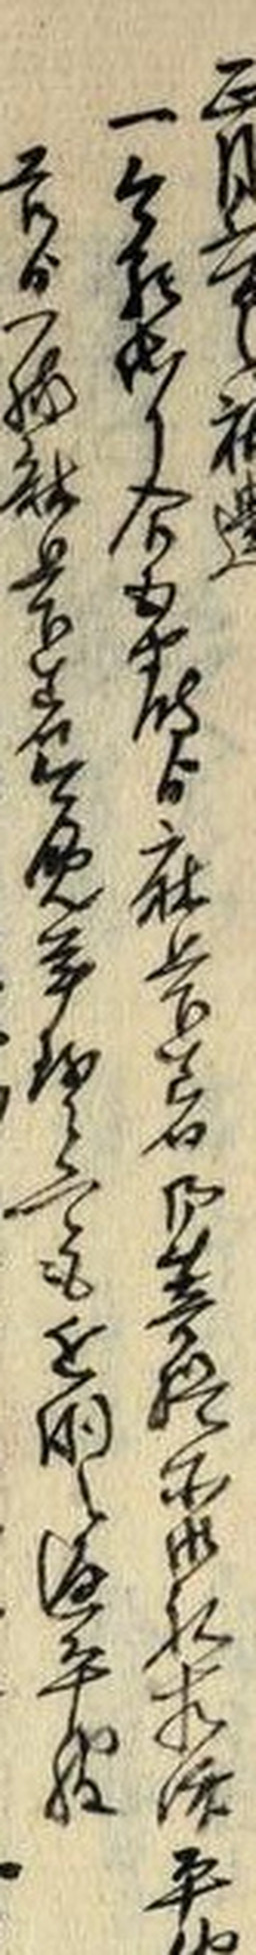節ゟ一統麻上下着今晩年越候へとも近例之通平服
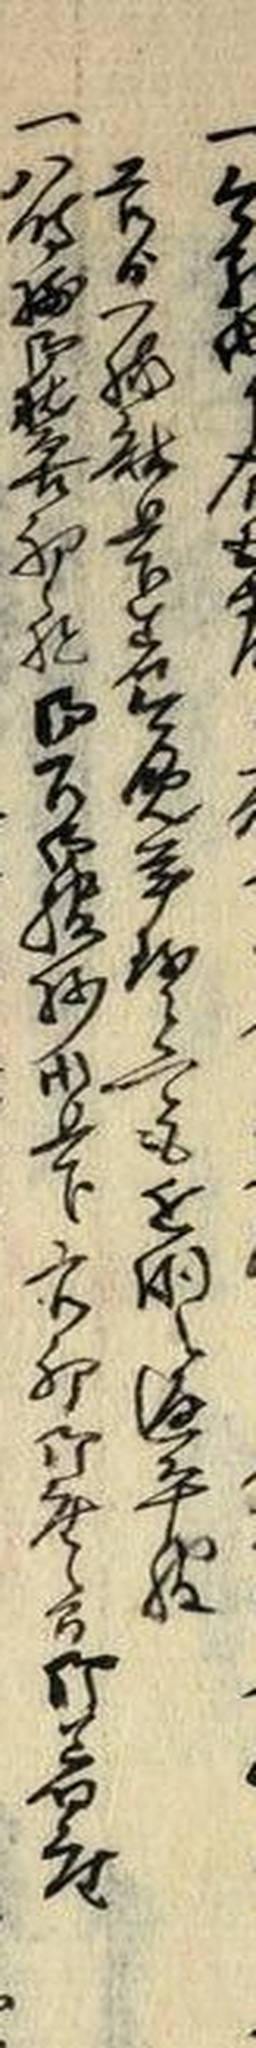一八時揃御稽古初被遊御召御服紗御上下最初御座之間御着座
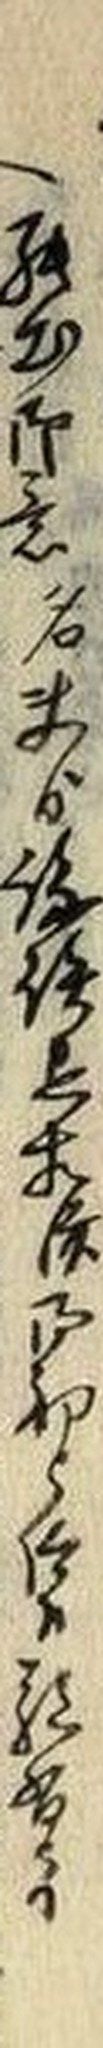罷出御意名夫ゟ講談申上相済御初被仰付難有旨
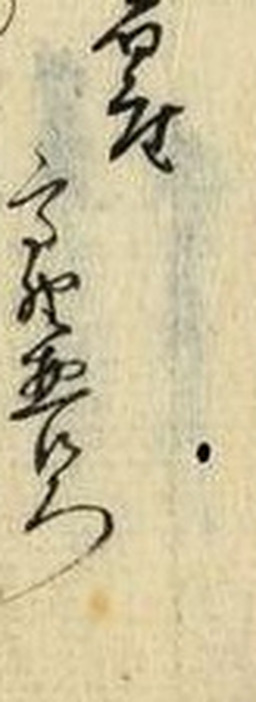高野惣左衛門
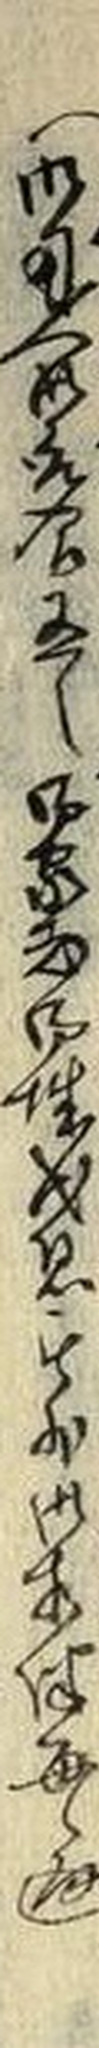御用人御取合有之御家老御城代息其外御相伴毎之通
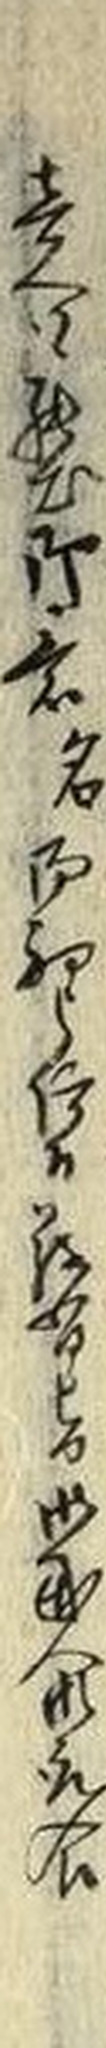壱人ツゝ罷出御意名御初被仰付難有旨御用人御取合
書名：少傅日録抄（斉承付側向頭取日記、在国）
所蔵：福井県文書館 Fukui Prefectural Archives
